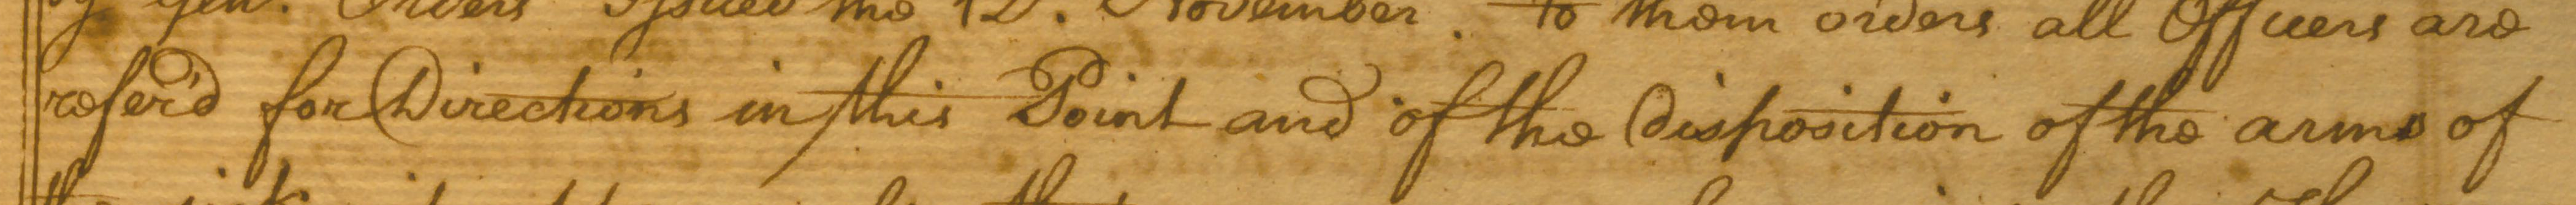refer'd for Directions in this Point and of the disposition of the arms of
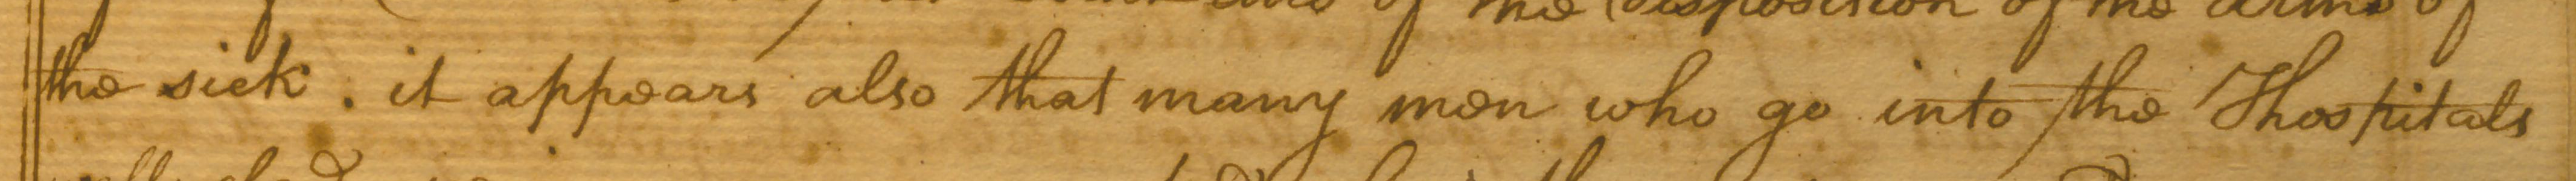the sick. it appears also that many men who go into the Hospitals
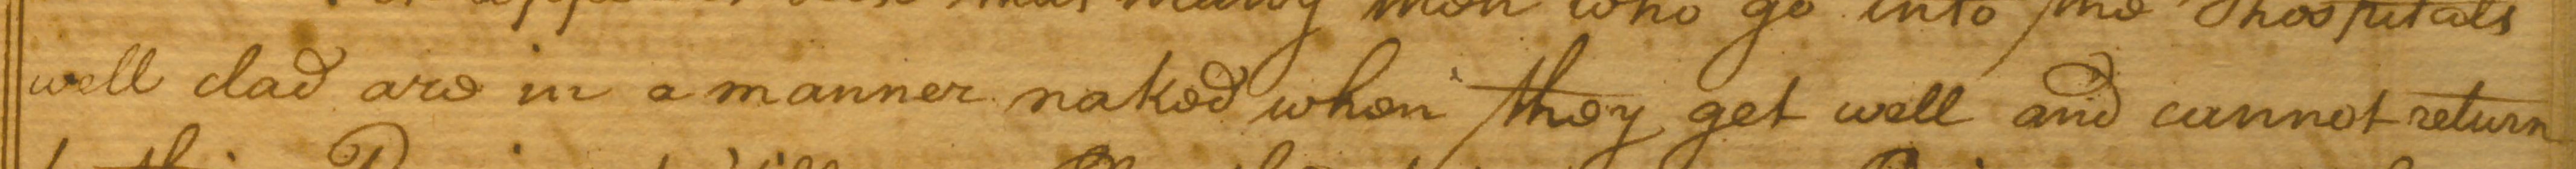well clad are in a manner naked when they get well and cannot return
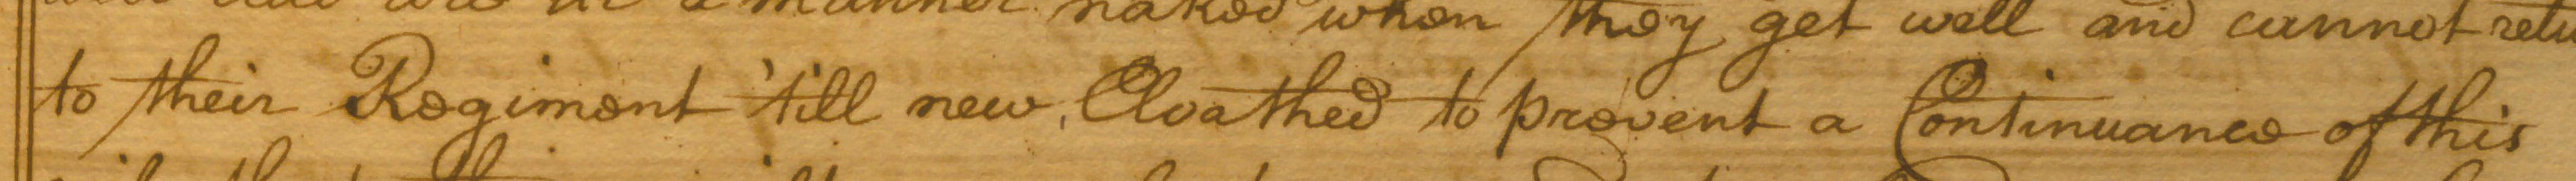to their Regiment 'till new Cloathed to prevent a Continuance of this
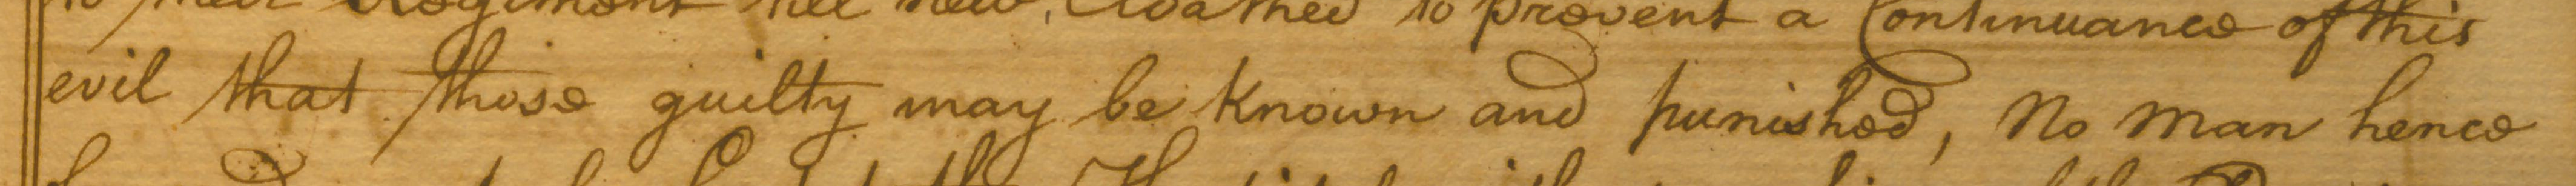evil that those guilty may be known and punished, no man hence
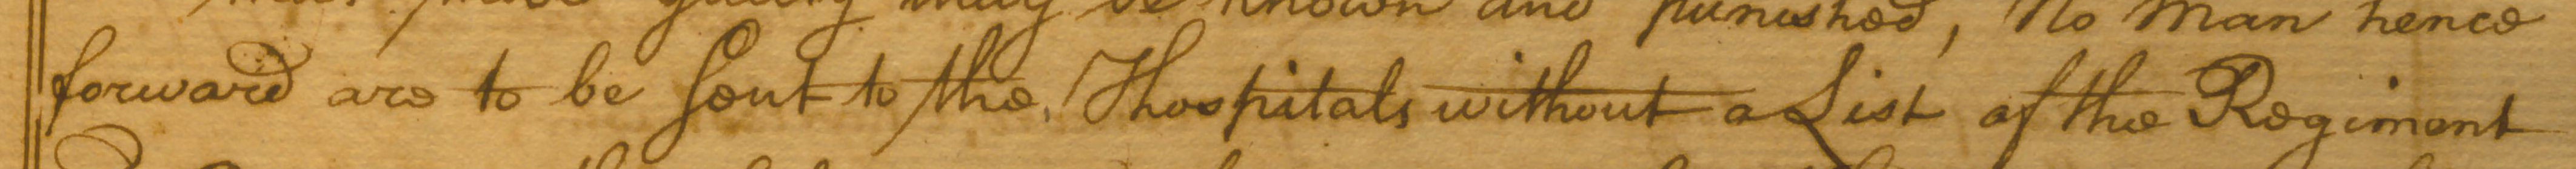forward are to be sent to the Hospitals without a List of the Regiment
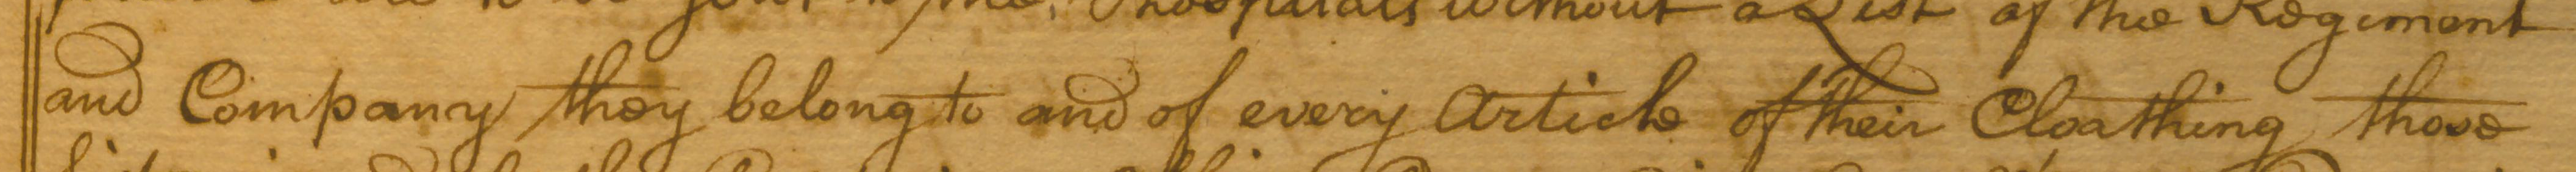and Company they belong to and of every Article of their Cloathing those
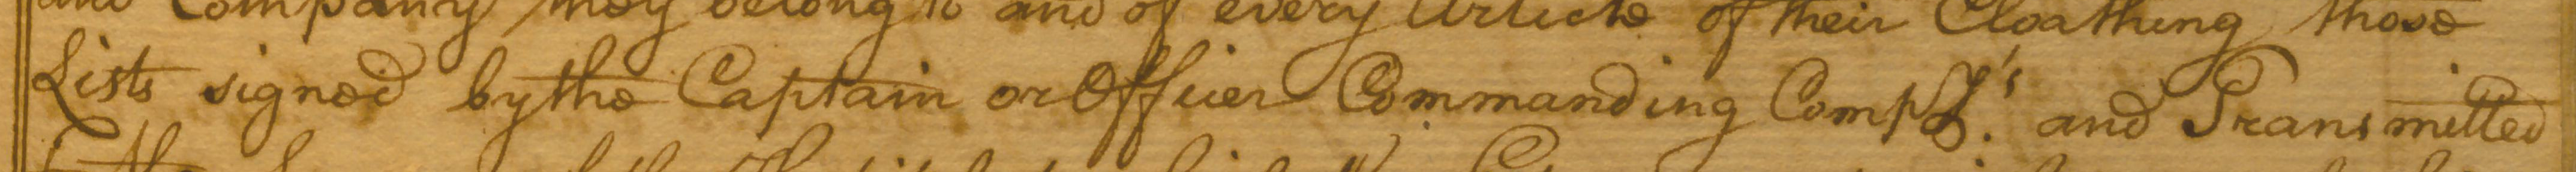Lists signed by the Captain or Officer Commanding Comp^y's: and Transmitted
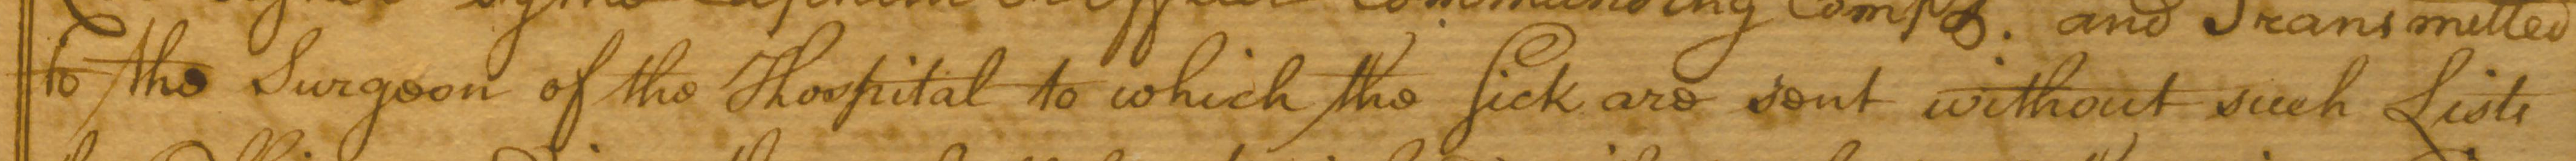to the Surgeon of the Hospital to which the Sick are sent without such Lists
